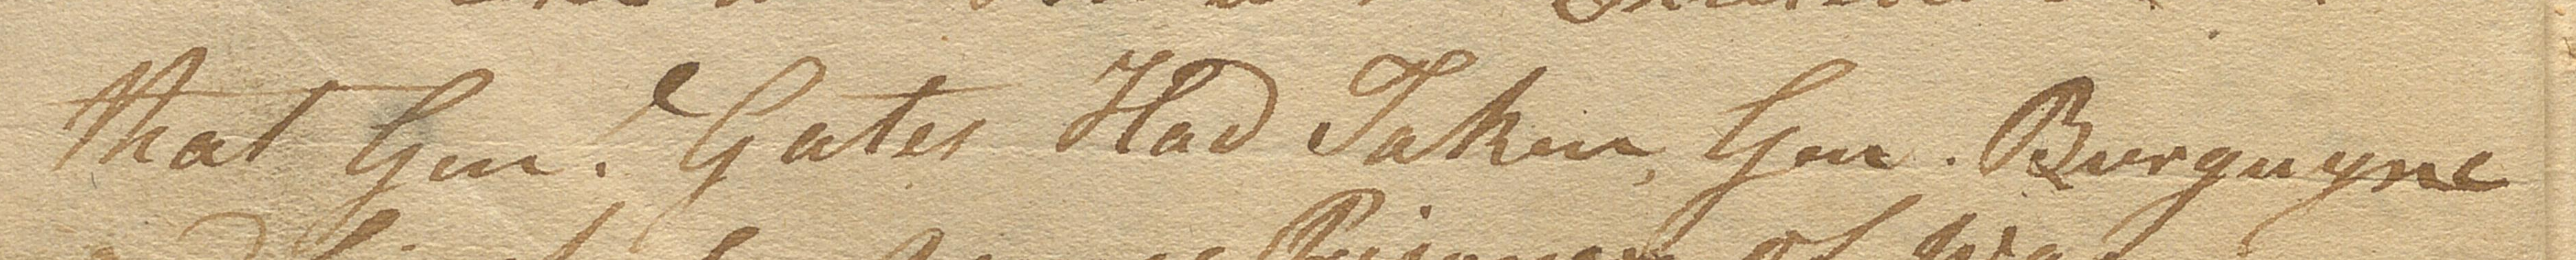that Gen^l. Gates Had Taken Genl. Burguyne
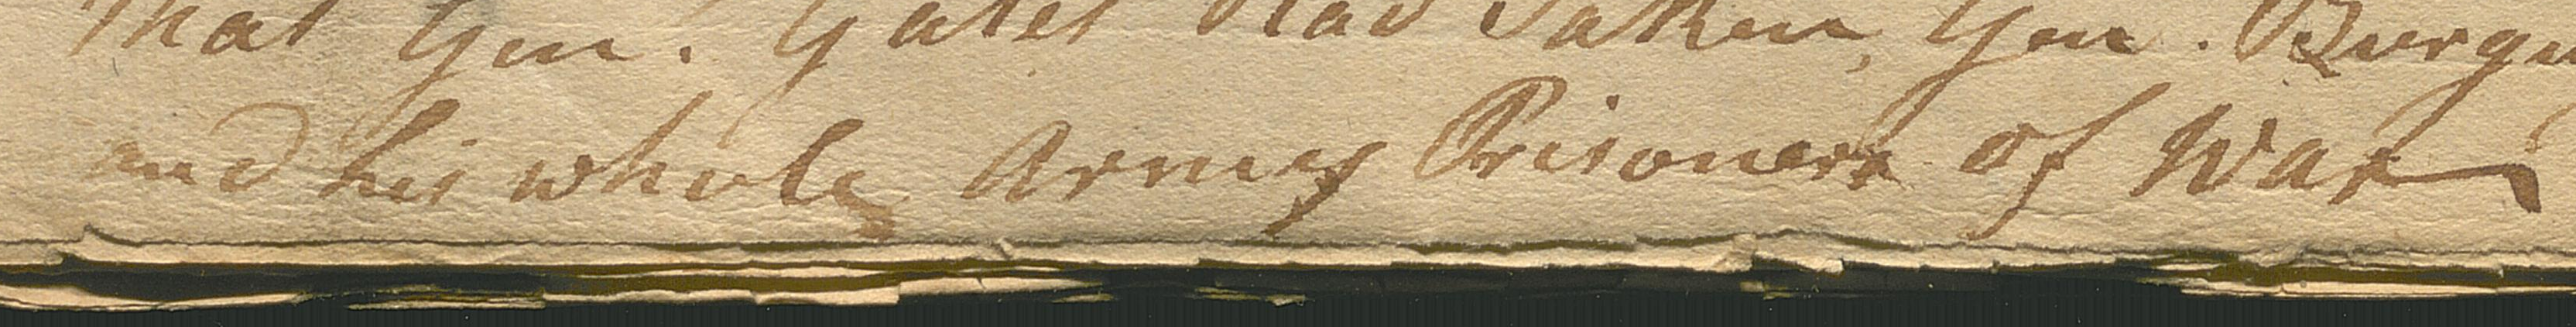ad his whole Army Prisoners of war
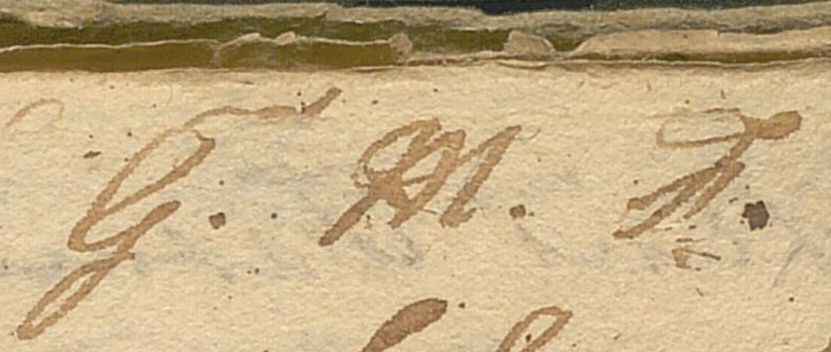G.. M. F.
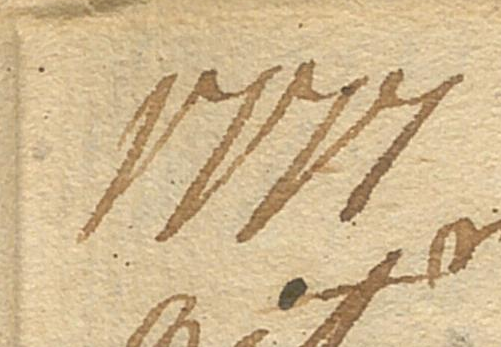1777
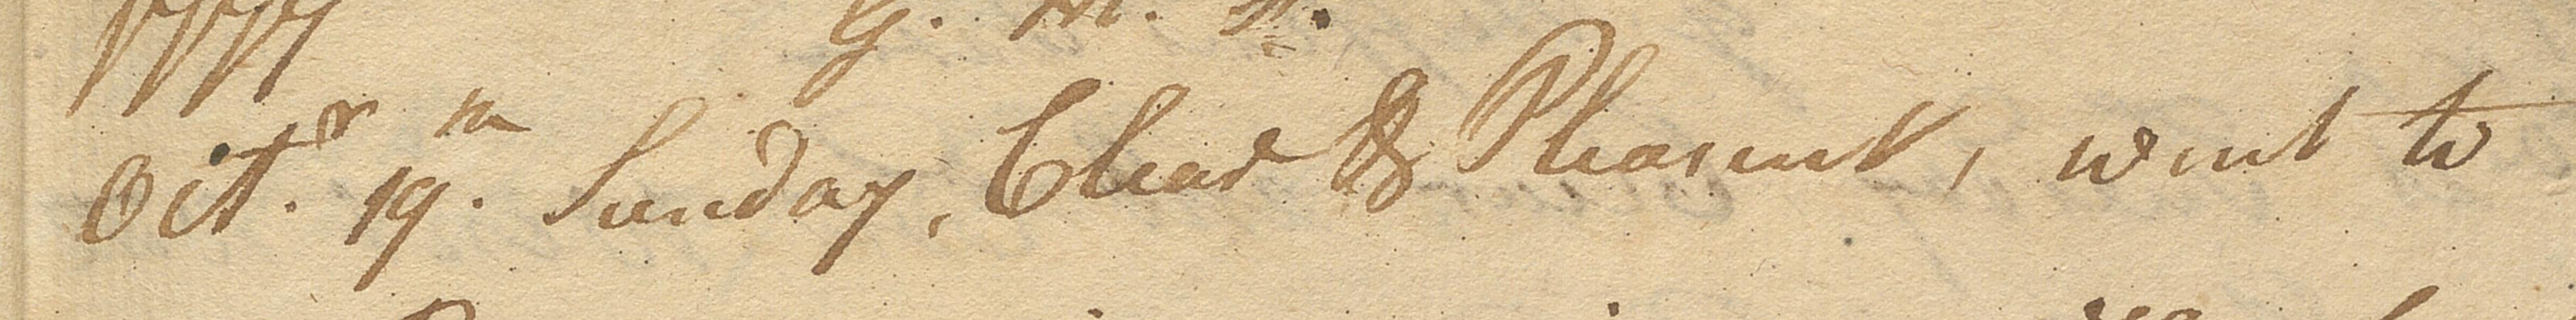Oct^r. 17^th. Sunday, Clear & Pleasent, went to
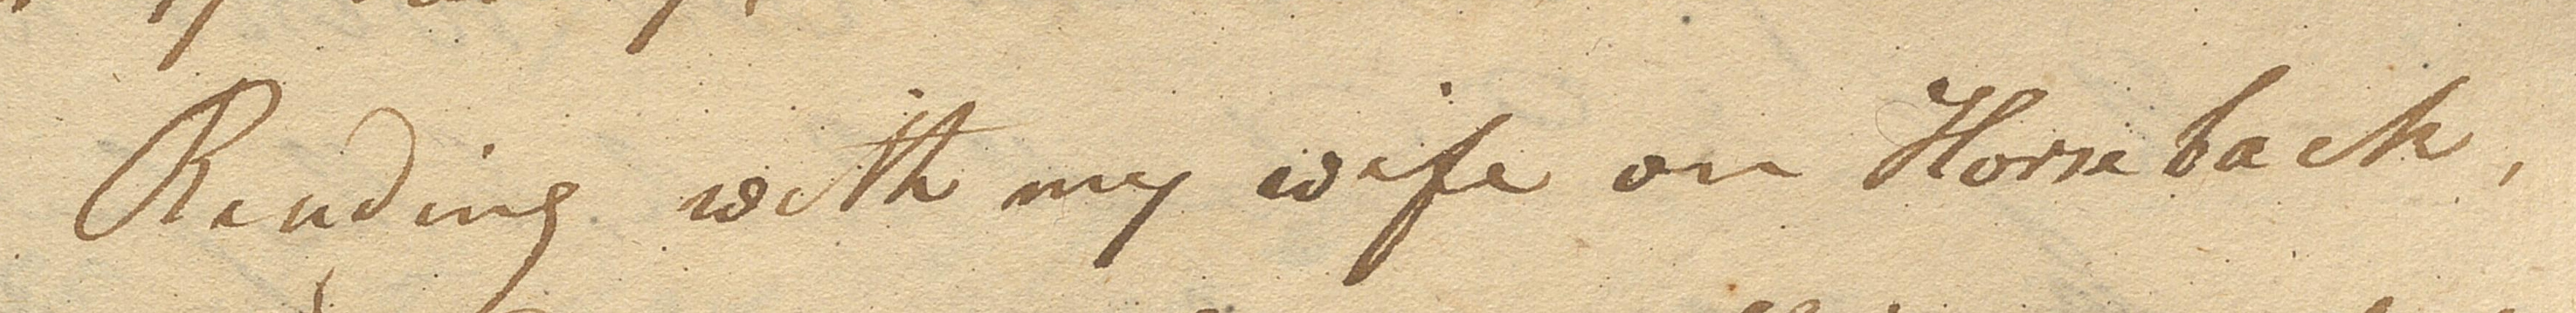Reading with my wife on Horseback,
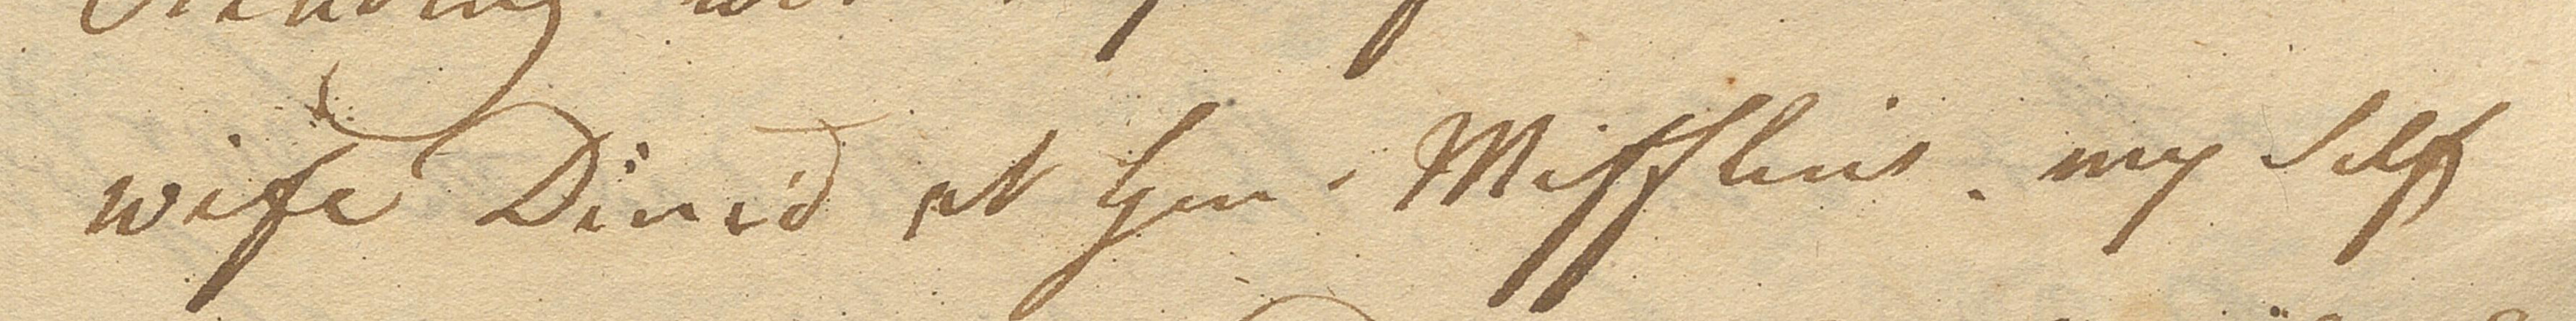wife Dined at Gen^l. Mifflins, my self
